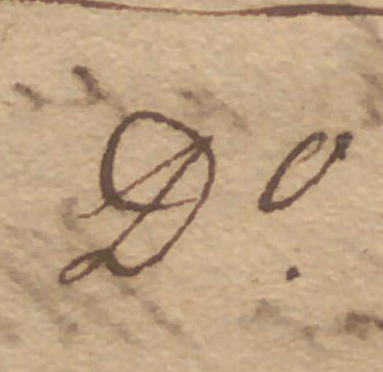D^o.
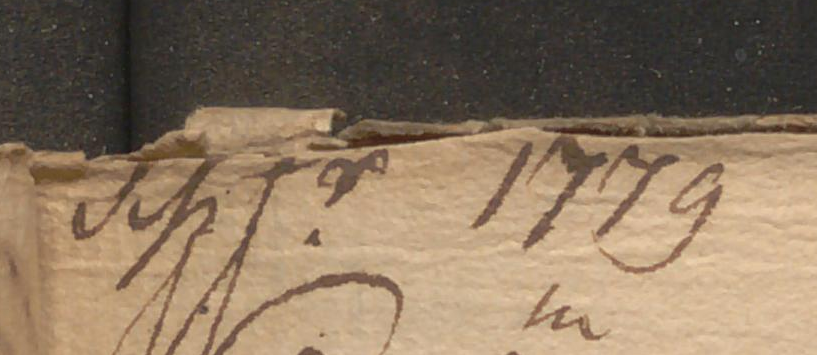Sept^r.1779
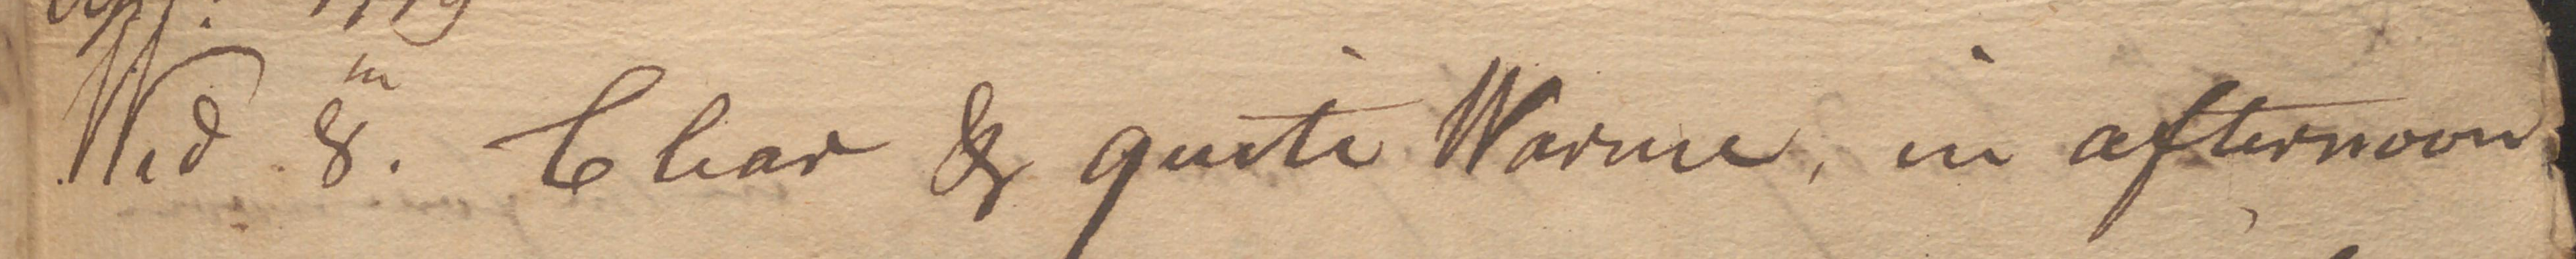Wed 8^th. Clear & quite Warme, in afternoon
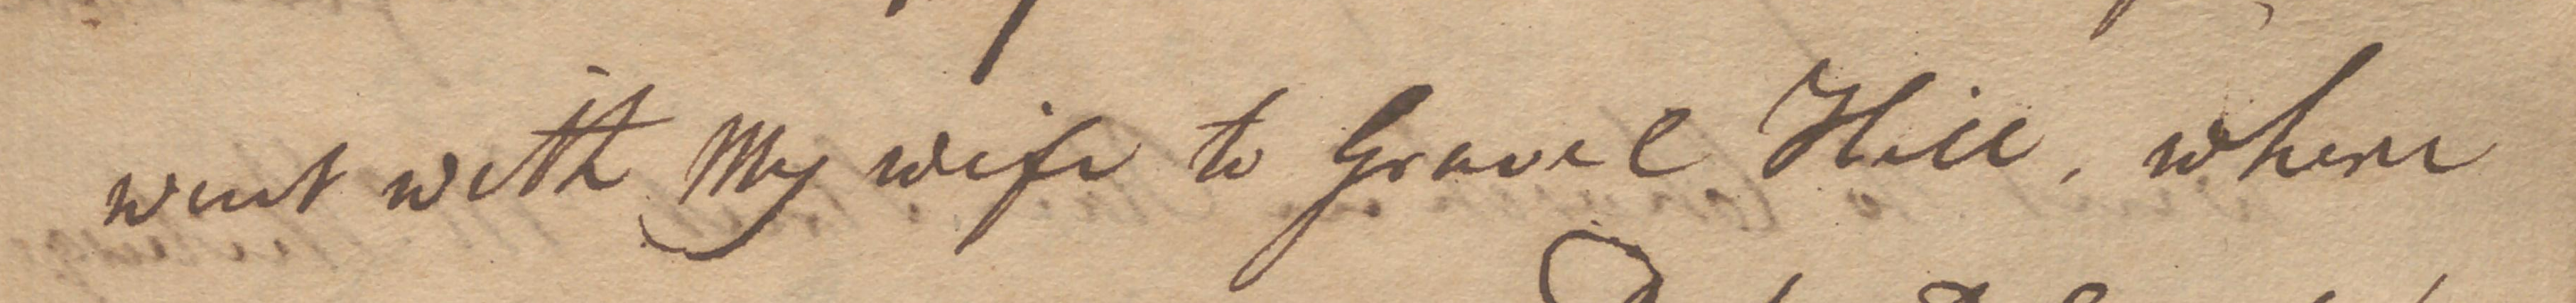went with my wife to Gravel Hill, where
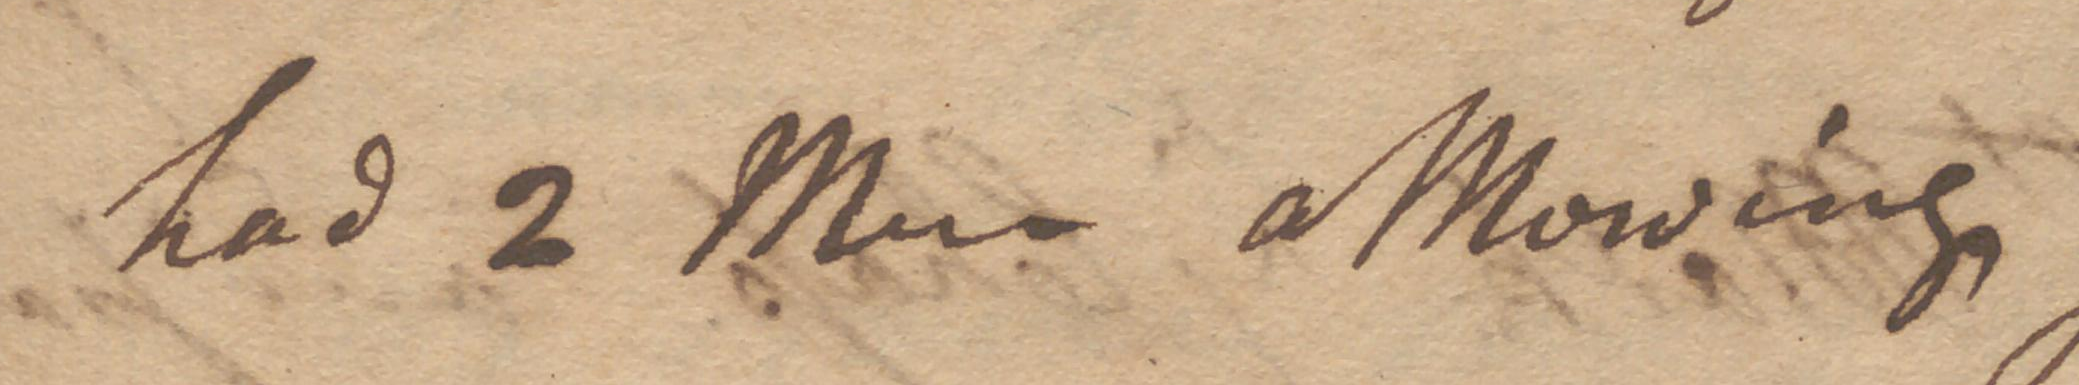had 2 Men a Mowing
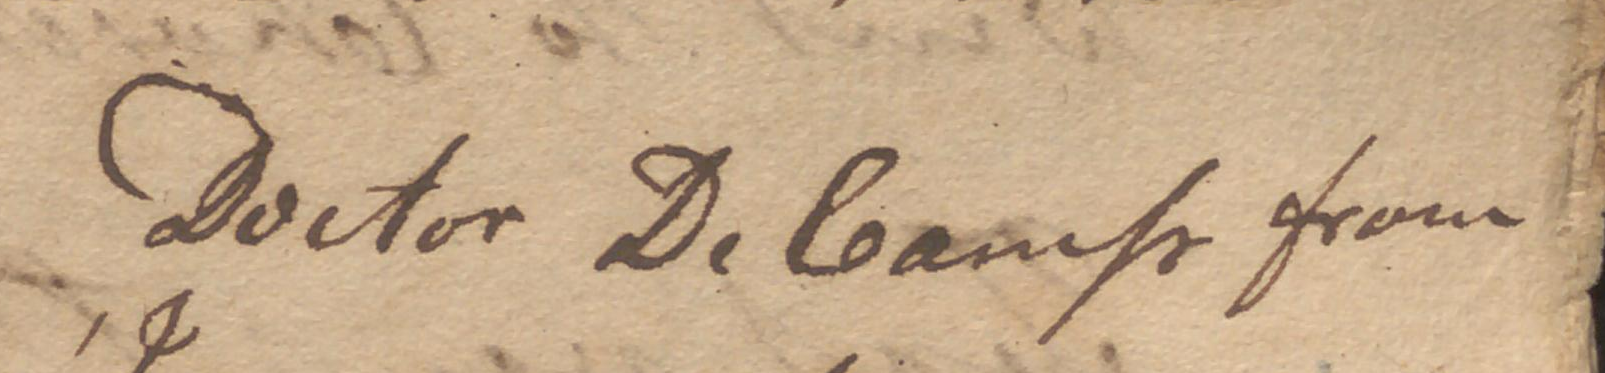Doctor DeCamp from
